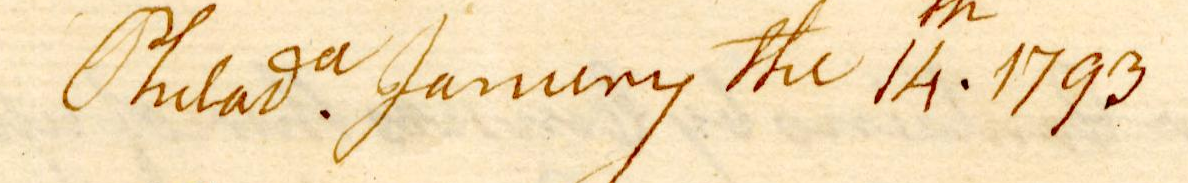Philad^a. January the 14^th. 1793
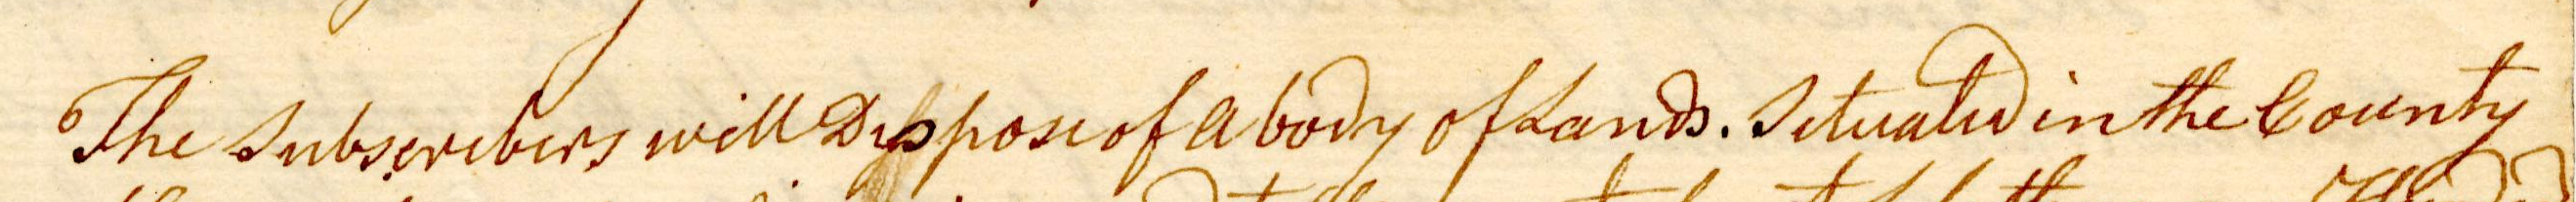The subscribers will Dispose of a body of Lands. Situated in the County
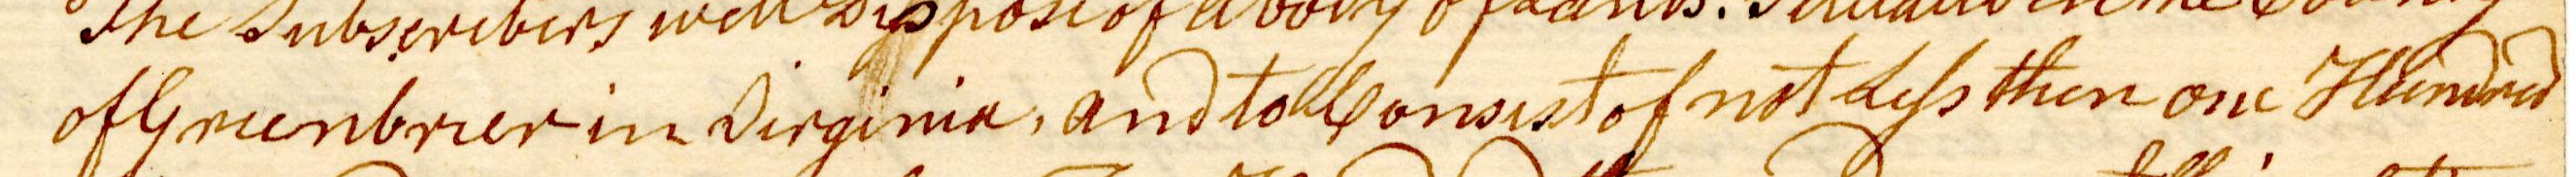of Greenbrier in Virginia, and to Consent to not Less then one Hundred
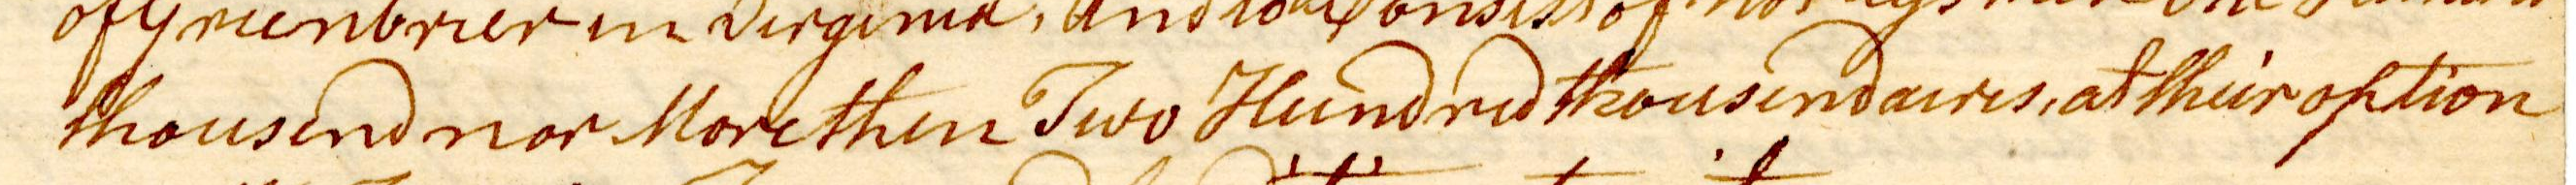thousand nor More then Two Hundred thousand acres, at their option
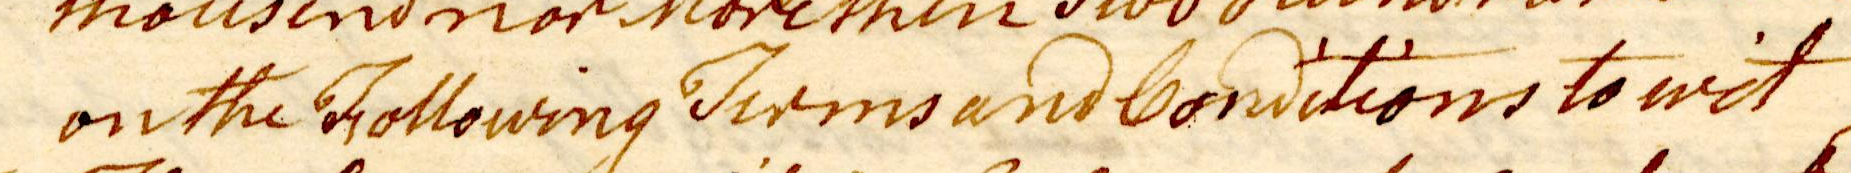on the Following Terms and Conditions to wit
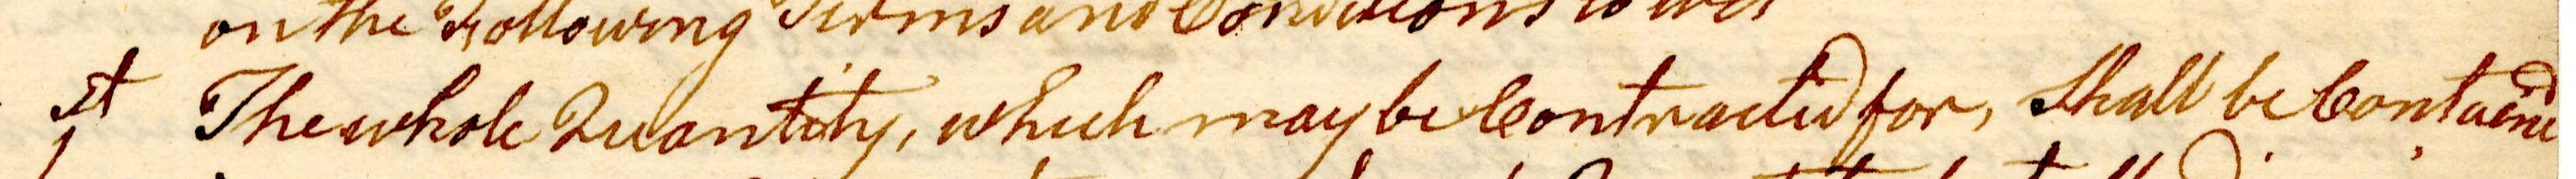1^st The whole Quantity, which maybe contracted for, Shall be Contained
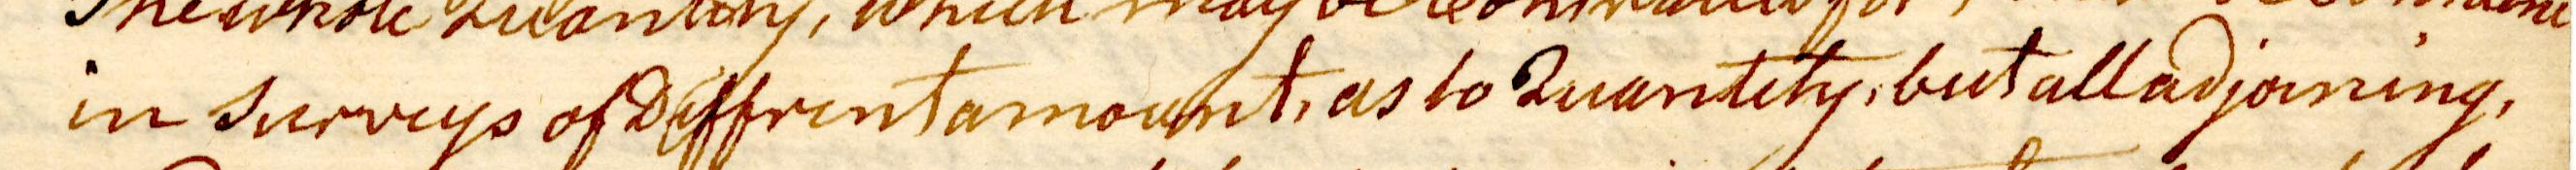in surveys of Diffrent amounts, as to Quantity, but all adjoining,
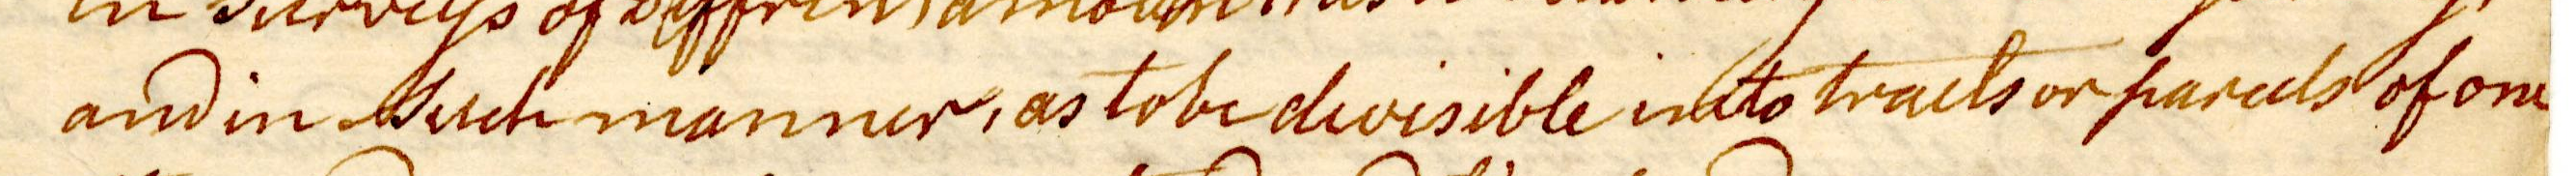and in such manner, as to be divisible into tracts or parcels of one
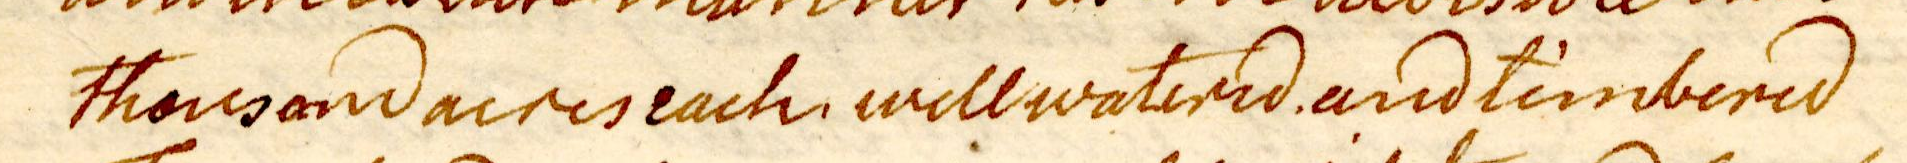thousand acres each well watered and timbered
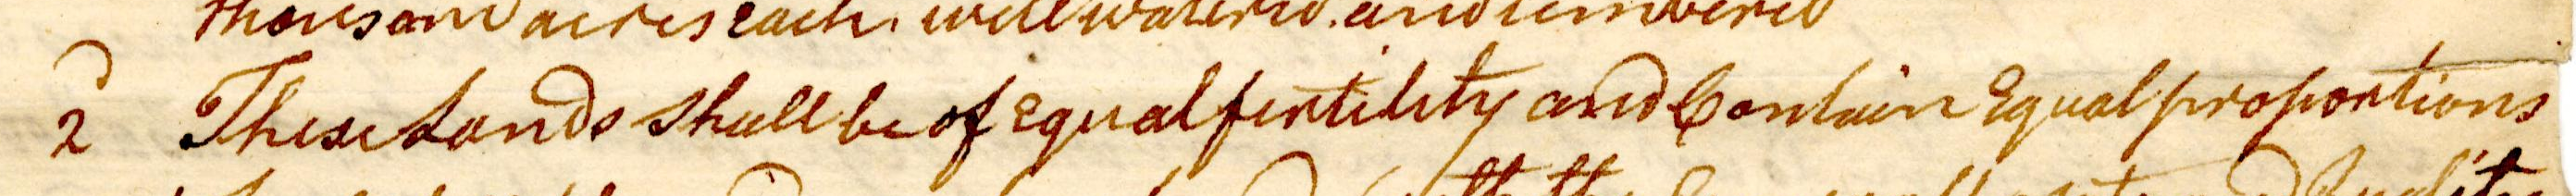2^d These Lands shall be of Equal fertility and Contain Equal proportions
